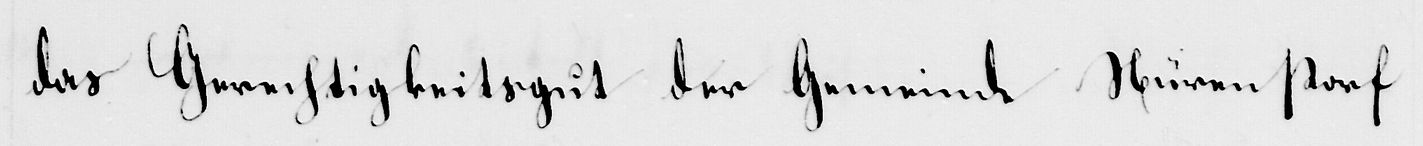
das Gerechtigkeitsgut der Gemeinde Nürenstorf
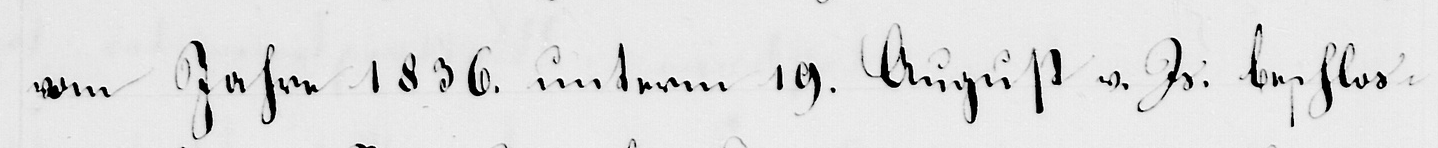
vom Jahre 1836. unterm 19. August v. Js. beschlos¬
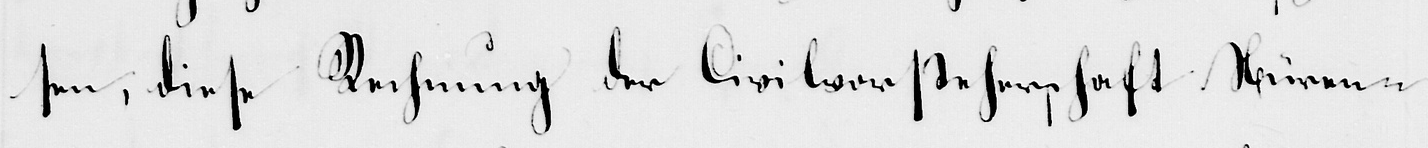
sen, diese Rechnung der Civilvorsteherschaft Nüren¬
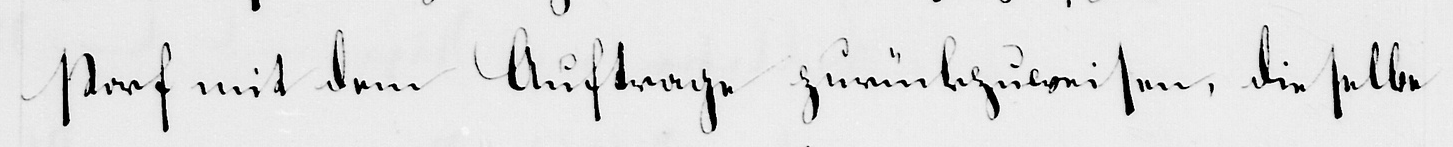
storf mit dem Auftrage zurückzuweisen, dieselbe
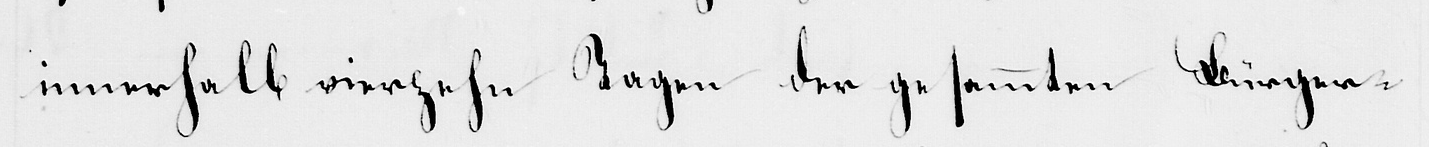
innerhalb vierzehn Tagen der gesammten Bürger¬
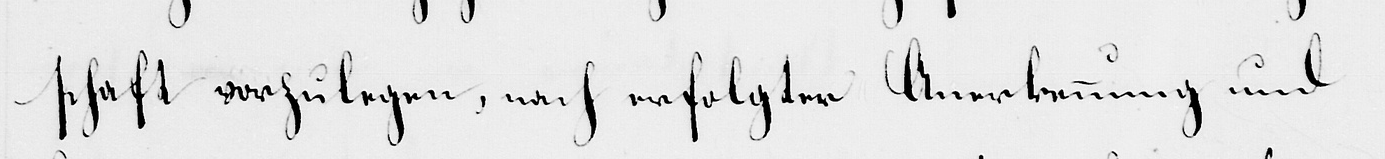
schaft vorzulegen, nach erfolgter Anerkennung und
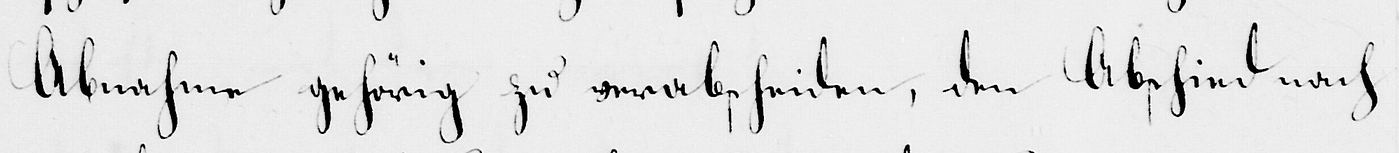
Abnahme gehörig zu verabscheiden, den Abschied nach
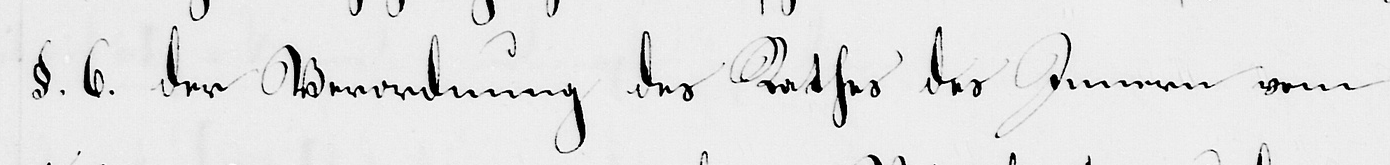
§. 6. der Verordnung des Rathes des Innern vom
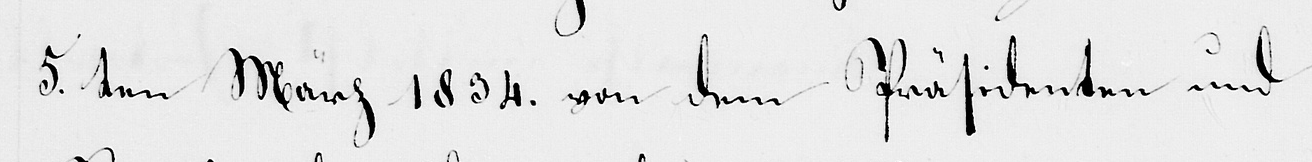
5. ten März 1834. von dem Präsidenten und
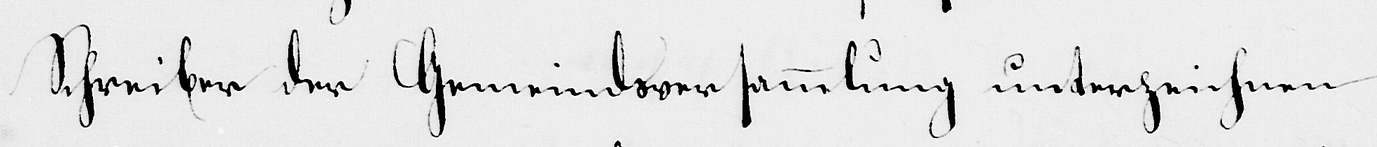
Schreiber der Gemeindsversammlung unterzeichnen
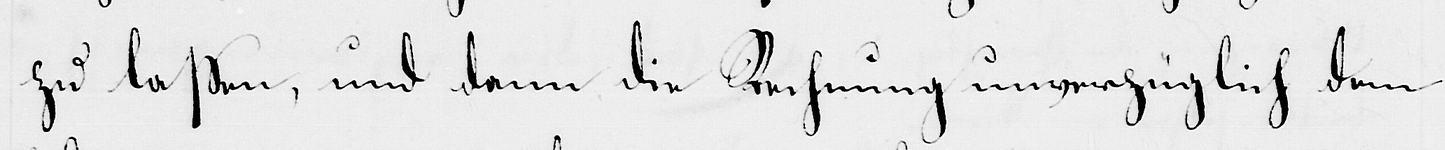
zu laßen, und dann die Rechnung unverzüglich dem
